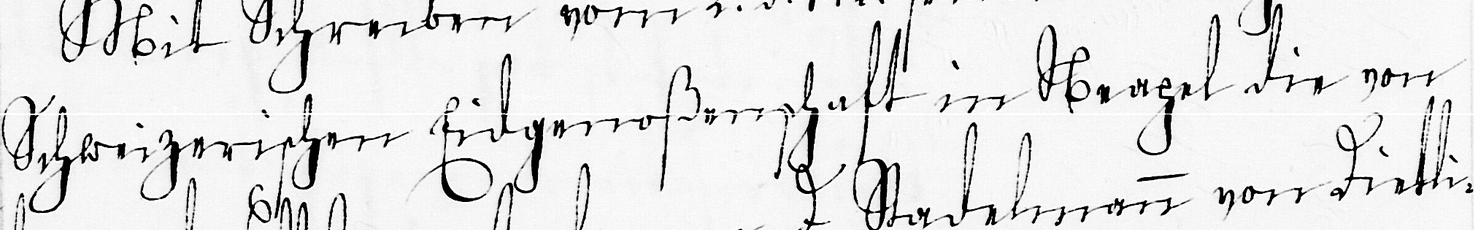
Schweizerischen Eidgenoßenschaft in Neapel die von
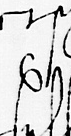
6.
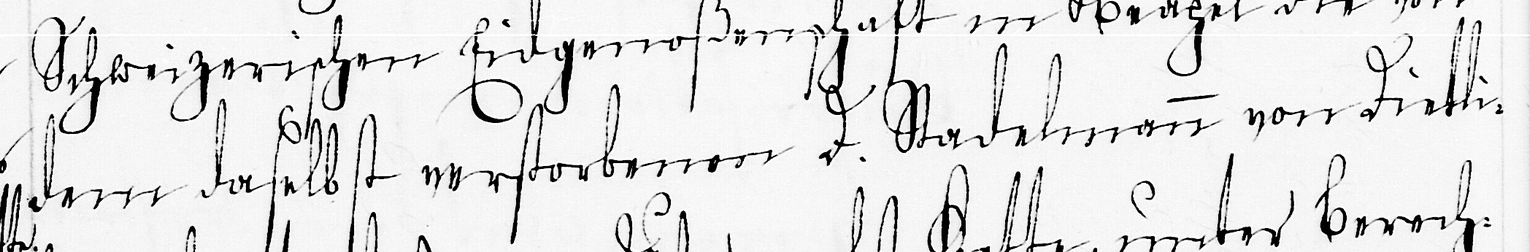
dem daselbst verstorbenen D. Stadelmann von Dietli¬
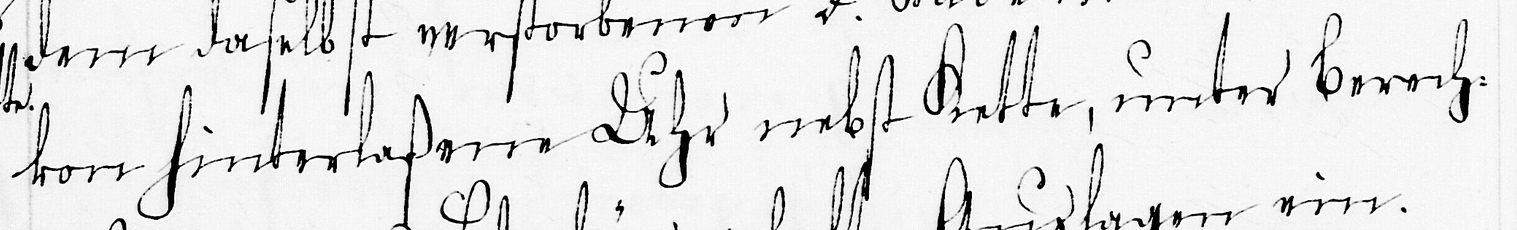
kon hinterlaßene Uhr nebst Kette, unter Berech¬
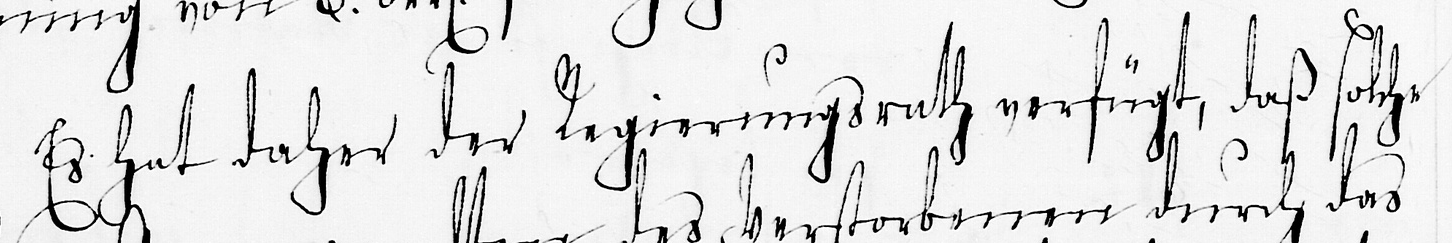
Es hat daher der Regierungsrath verfügt, daß solc¬
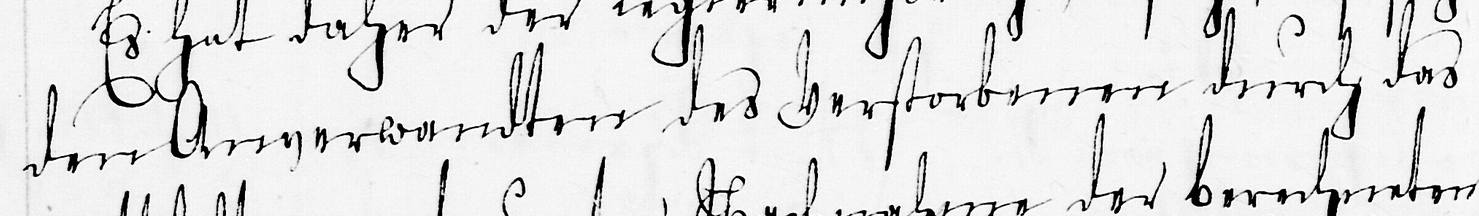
den Anverwandten des Verstorbenen durch das
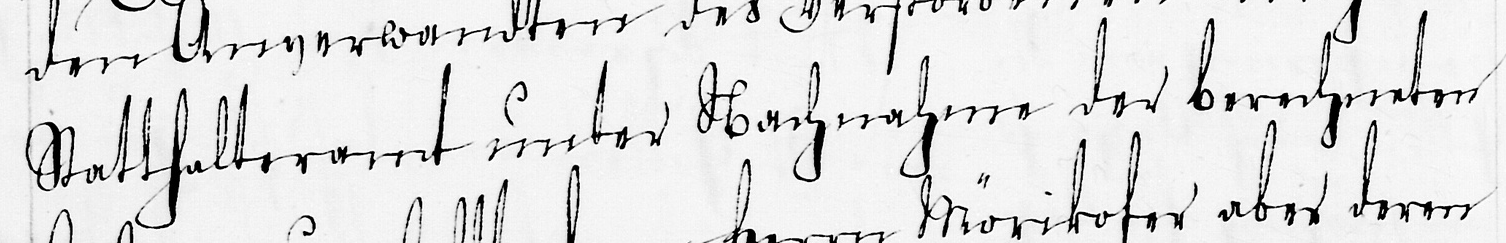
Statthalteramt unter Nachnahme der berechneten
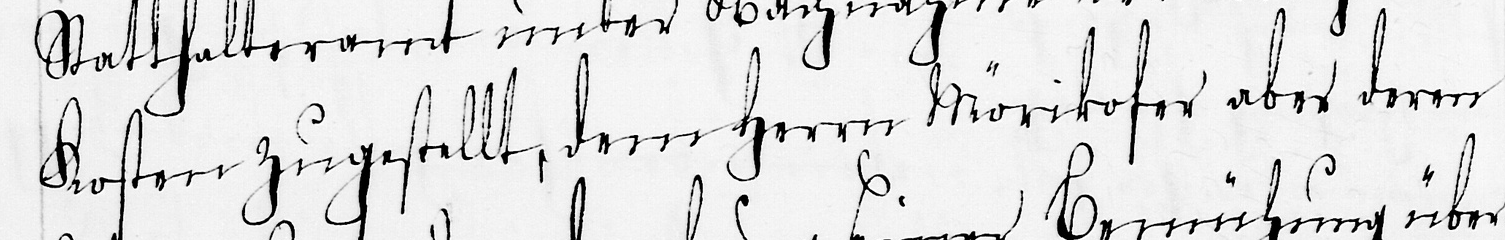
Kosten zugestellt, dem Herrn Mörikofer aber deren
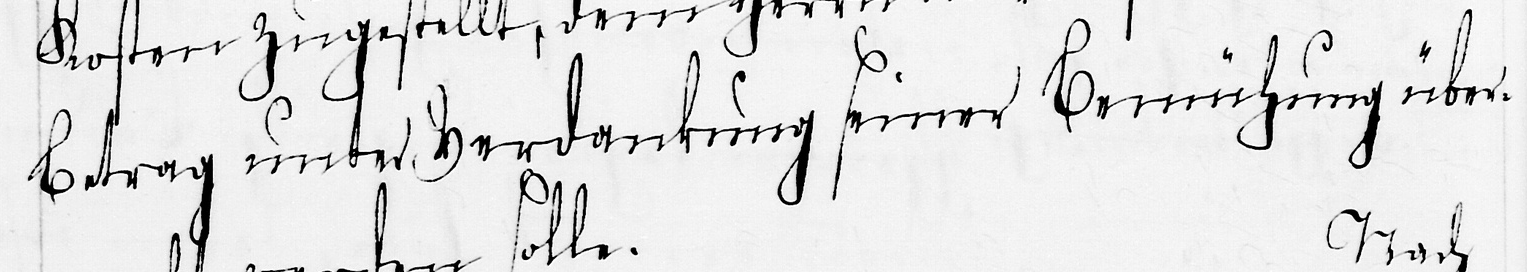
Betrag unter Verdankung seiner Bemühung über¬
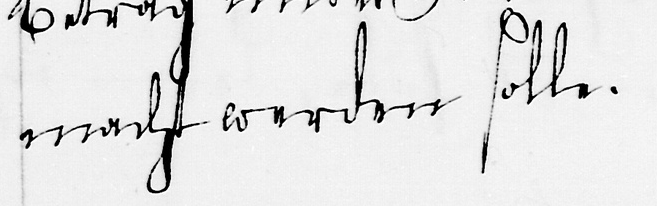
macht werden solle.
